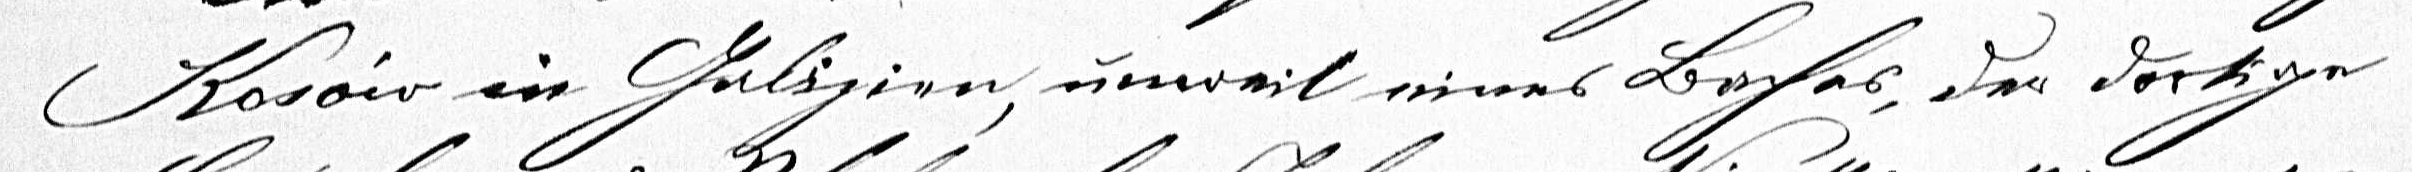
Kosów in Galizien, unweit eines Baches, der dortige
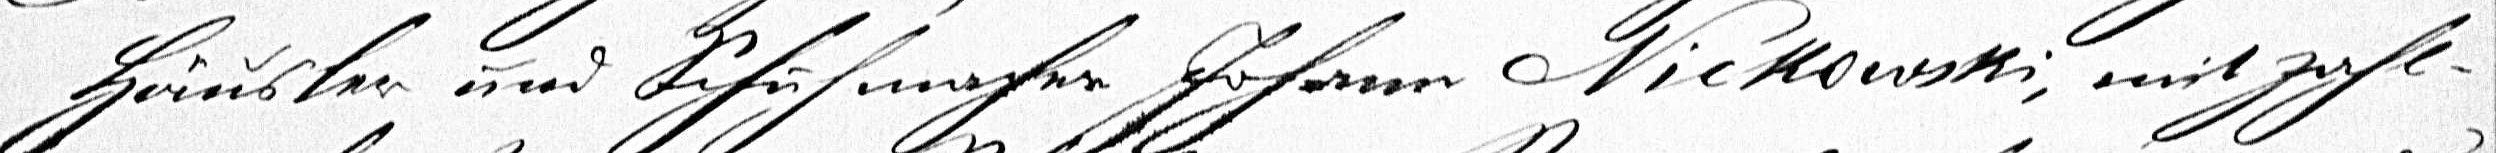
Häusler und Schuhmacher Johann Nickowski, mit zahl¬
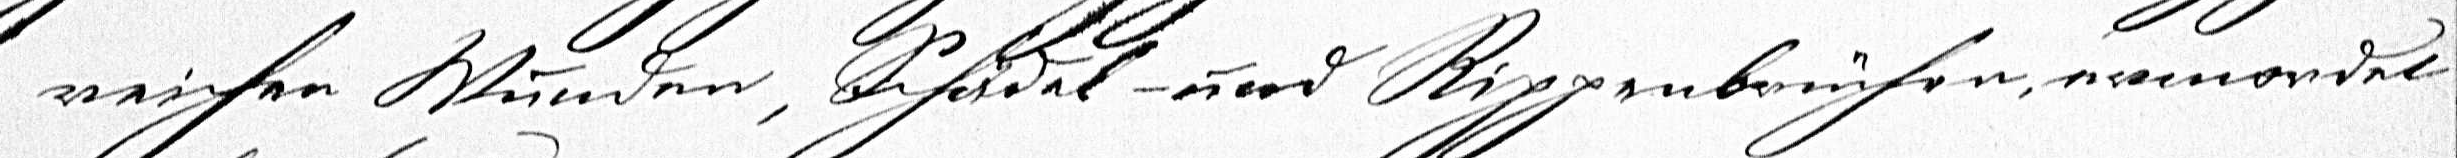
reichen Wunden, Schädel- und Rippenbrüchen, ermordet
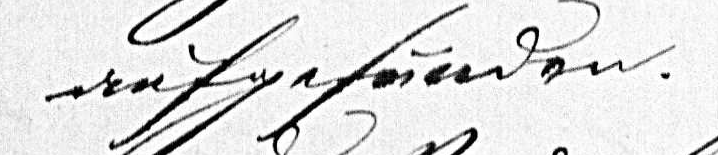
aufgefunden.
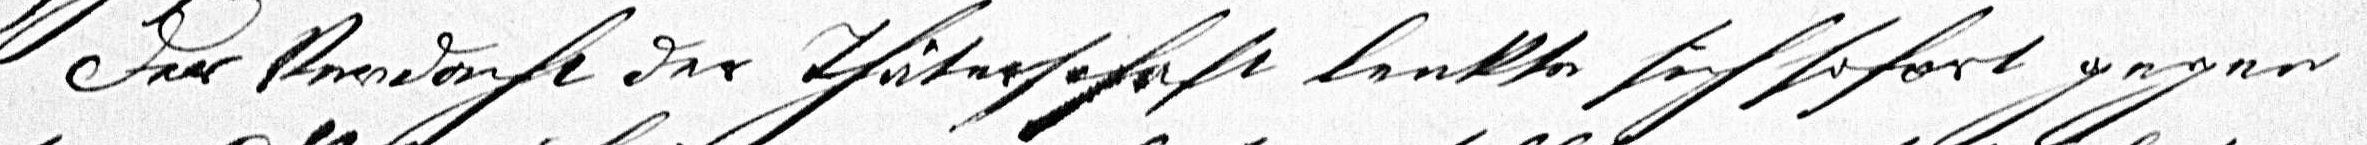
Der Verdacht der Thäterschaft lenkte sich sofort gegen
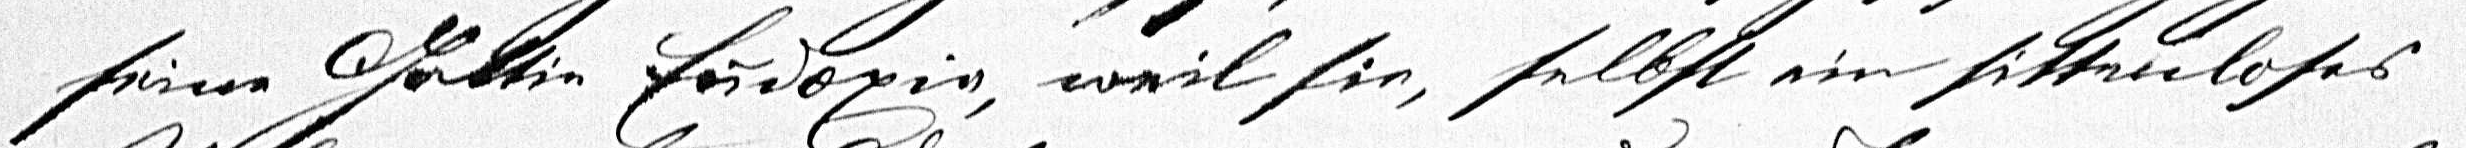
seine Gattin Eudoxia, weil sie, selbst ein sittenloses
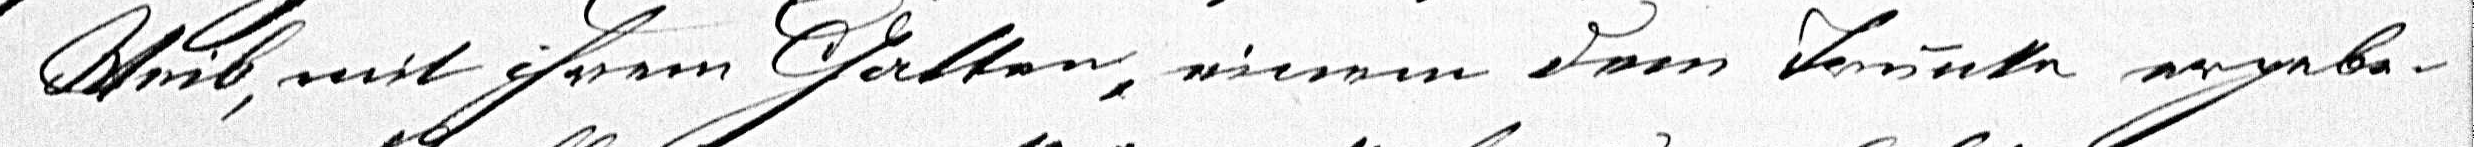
Weib, mit ihrem Gatten, einem dem Trunke ergebe¬
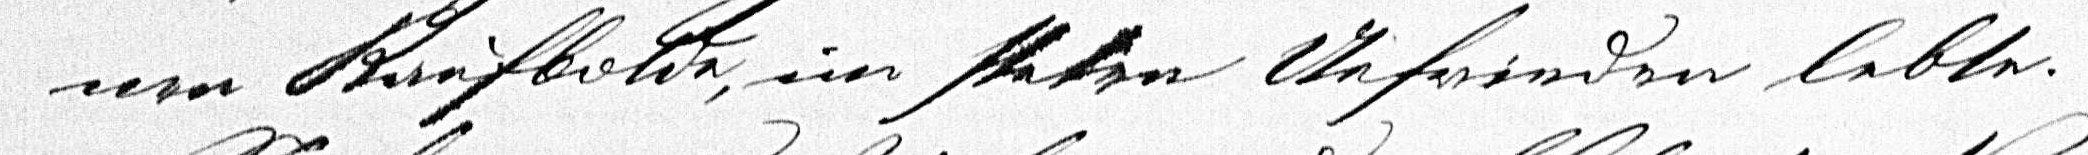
nen Raufbolde, im steten Unfrieden lebte.
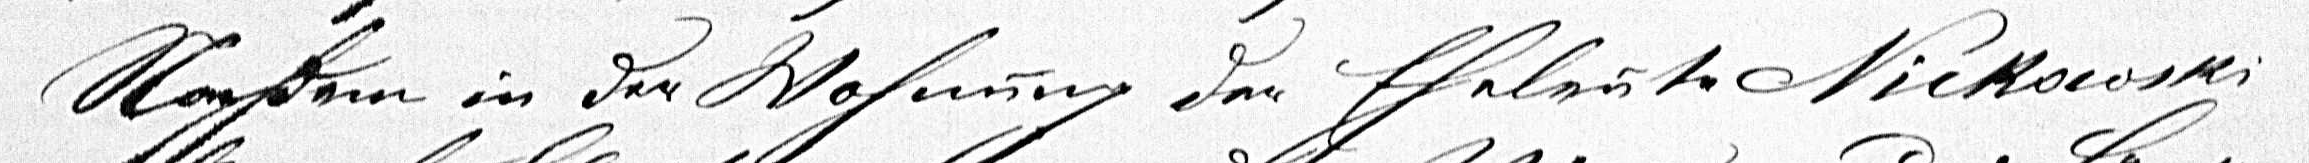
Nachdem in der Wohnung der Eheleute Nickowski
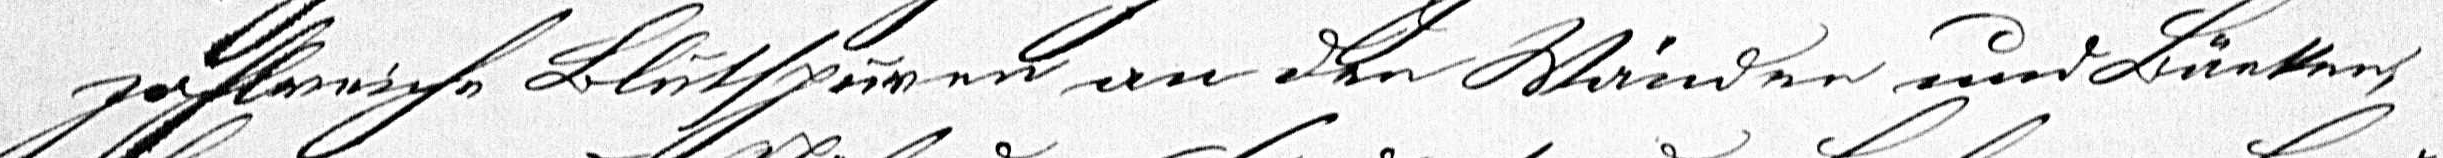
zahlreiche Blutspuren an den Wänden und Bänken,
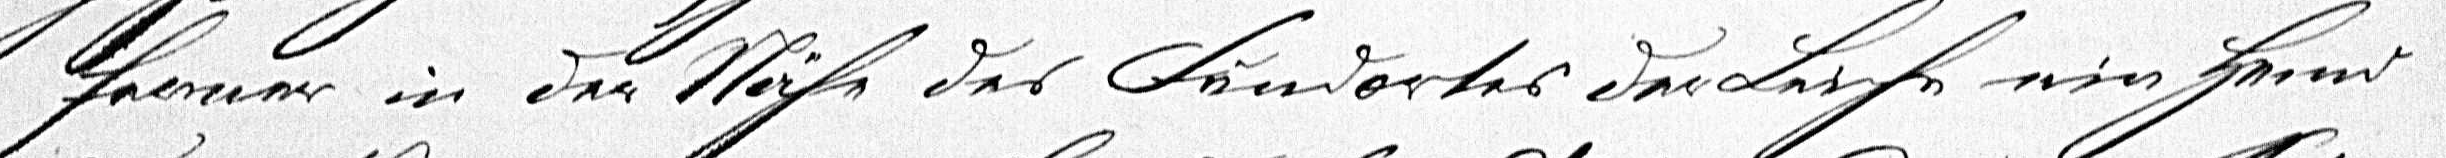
ferner in der Nähe des Fundortes der Leiche ein Hemd
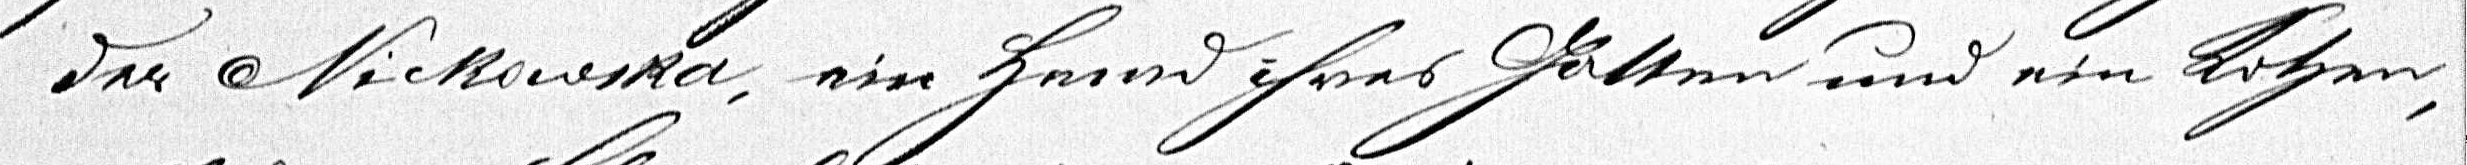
der Nickowska, ein Hemd ihres Gatten und ein Kotzen,
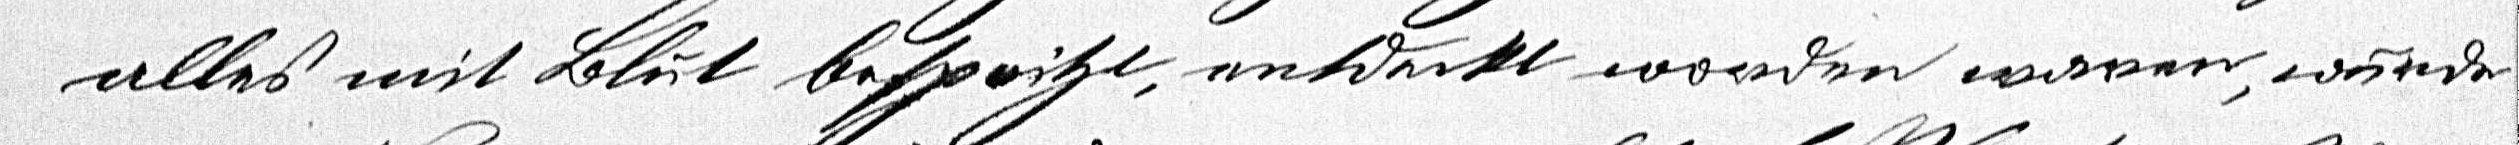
alles mit Blut bespritzt, entdeckt worden waren, wurde
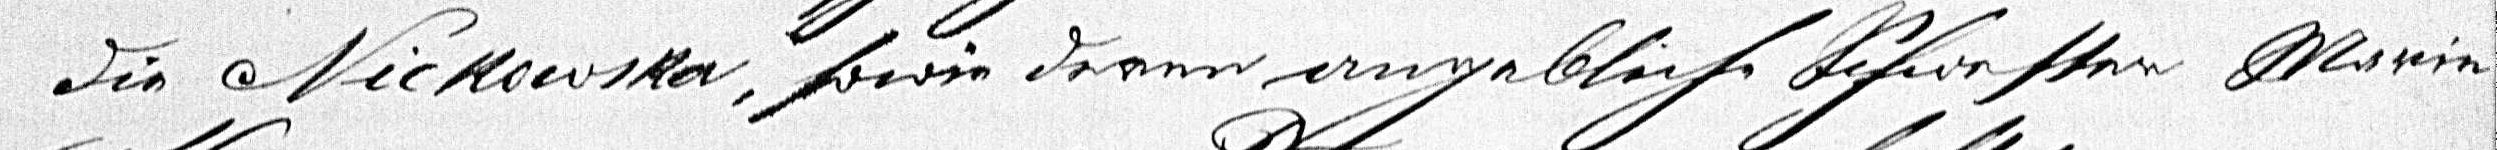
die Nickowska, sowie deren angebliche Schwester Marie
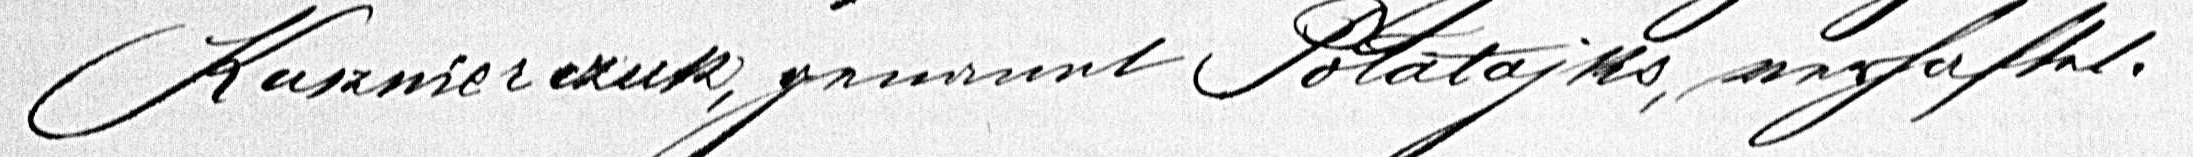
Kusznierczuk, genannt Połatajko, verhaftet.
